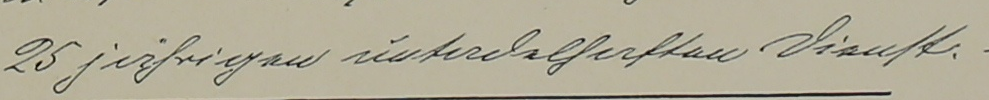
25jährigen untadelhaften Dienst.
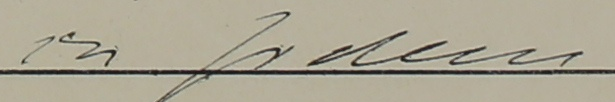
in fidem
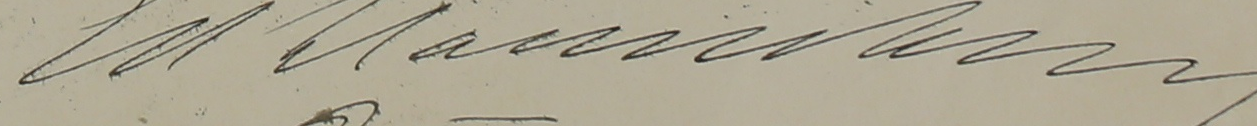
Ed.Stackelberg
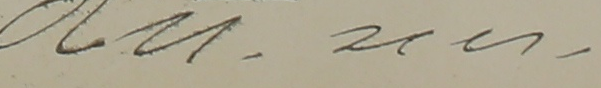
Ritt.secr.
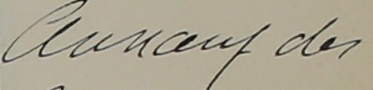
Ankauf des
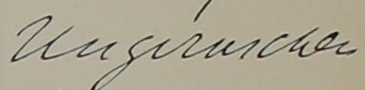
Ungernschen
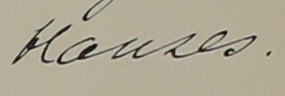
Hauses
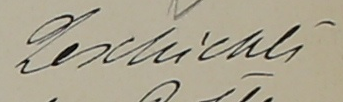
Geschichte
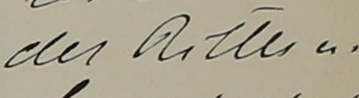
der Ritter u
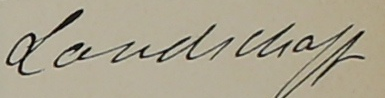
Landschaft
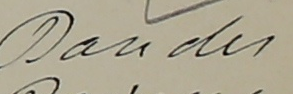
Bau der
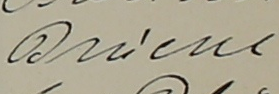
Brücke
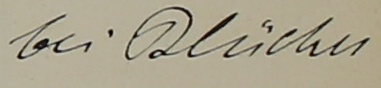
bei Blücher
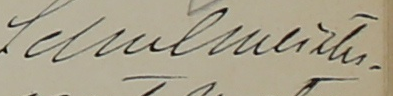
Schulmeister
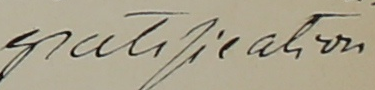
gratification
